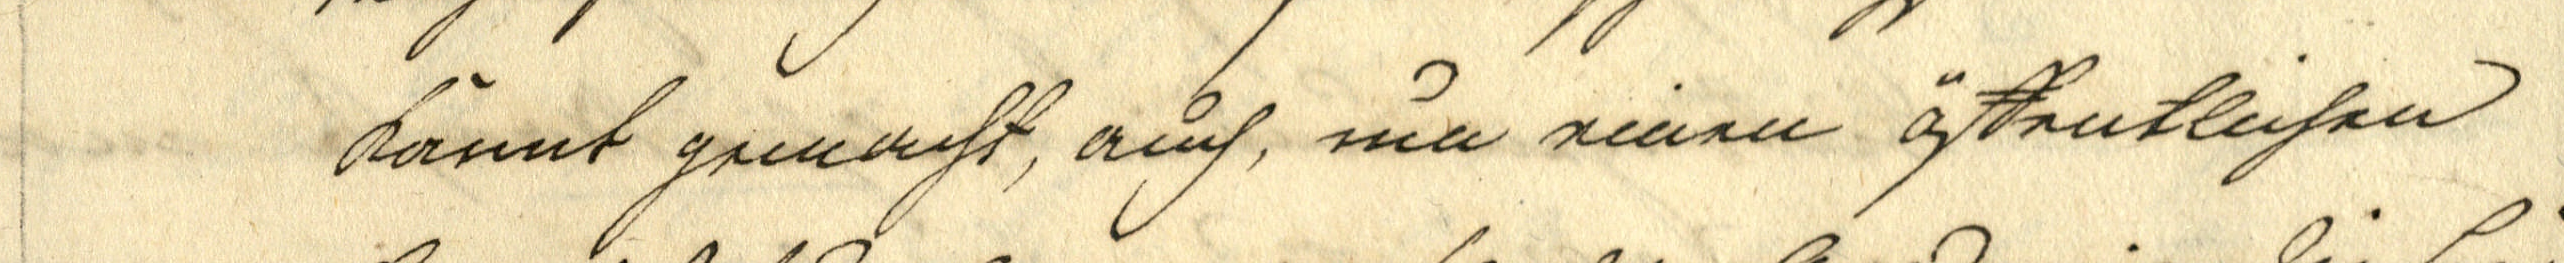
kannt gemacht, auch, um einen öffentlichen
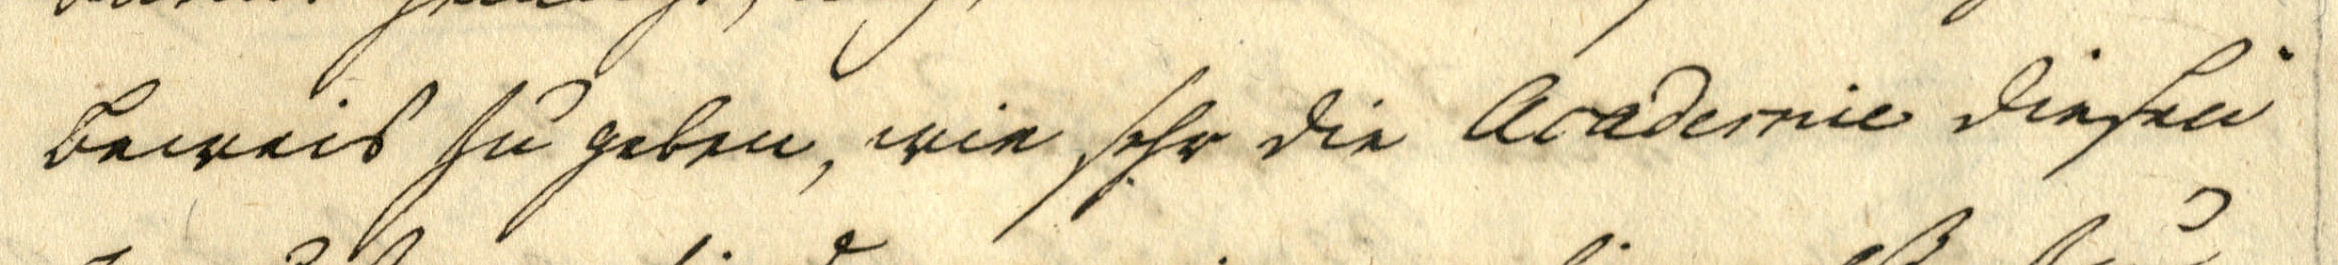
Beweis zu geben, wie sehr die Academie diesen
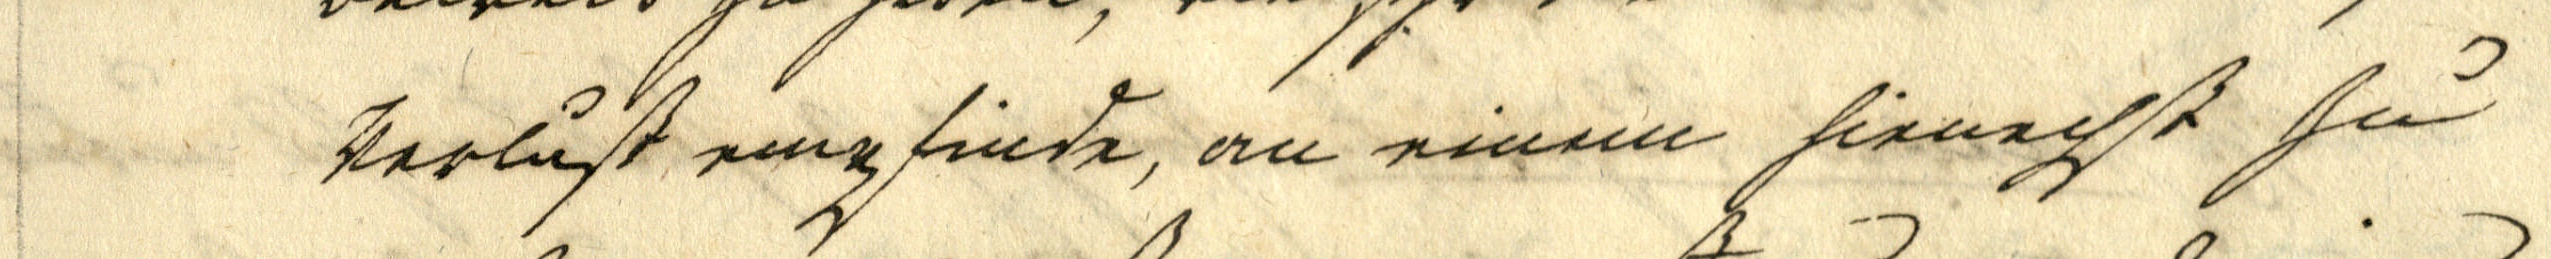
Verlust empfinde, an einem hienechst zu
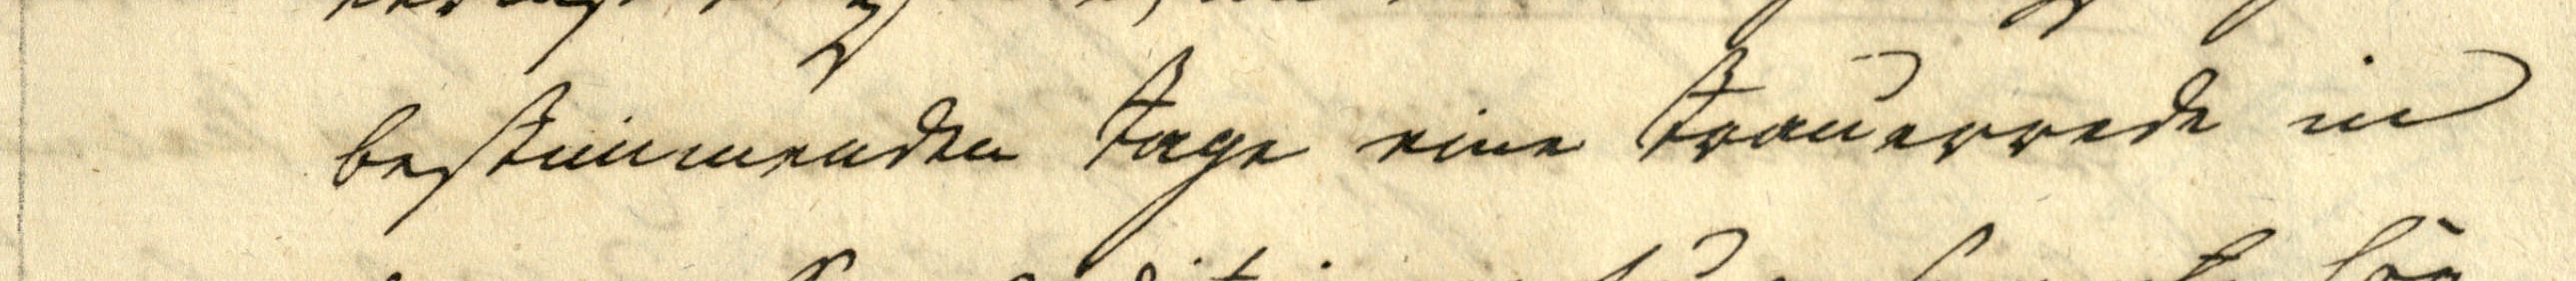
bestimmenden Tage eine Trauerrede in
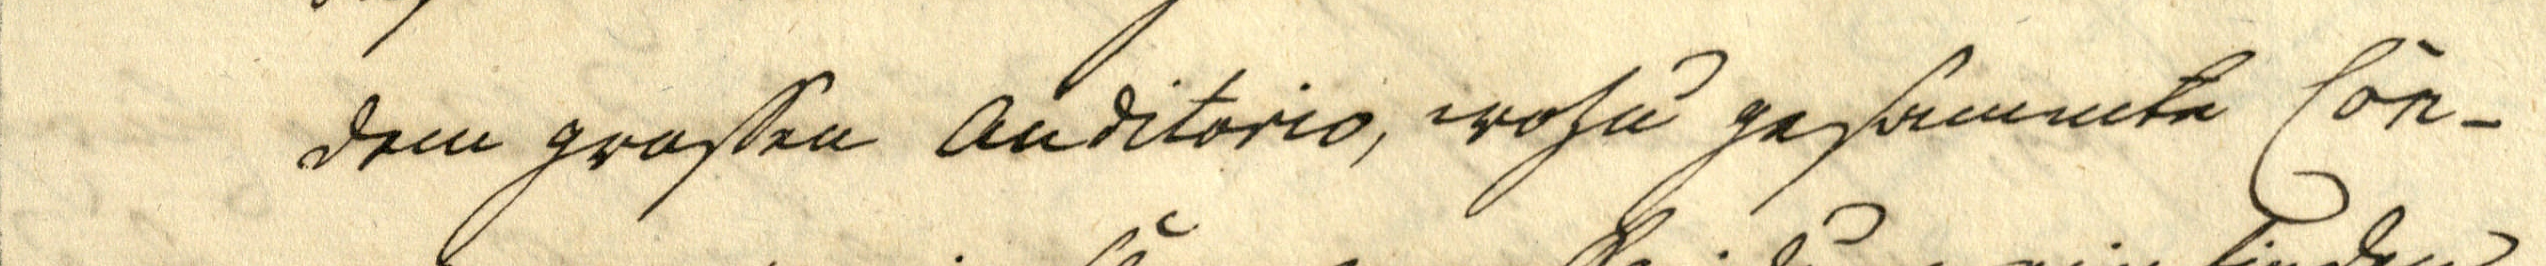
dem grossen Auditorio, wozu gesammete Con-
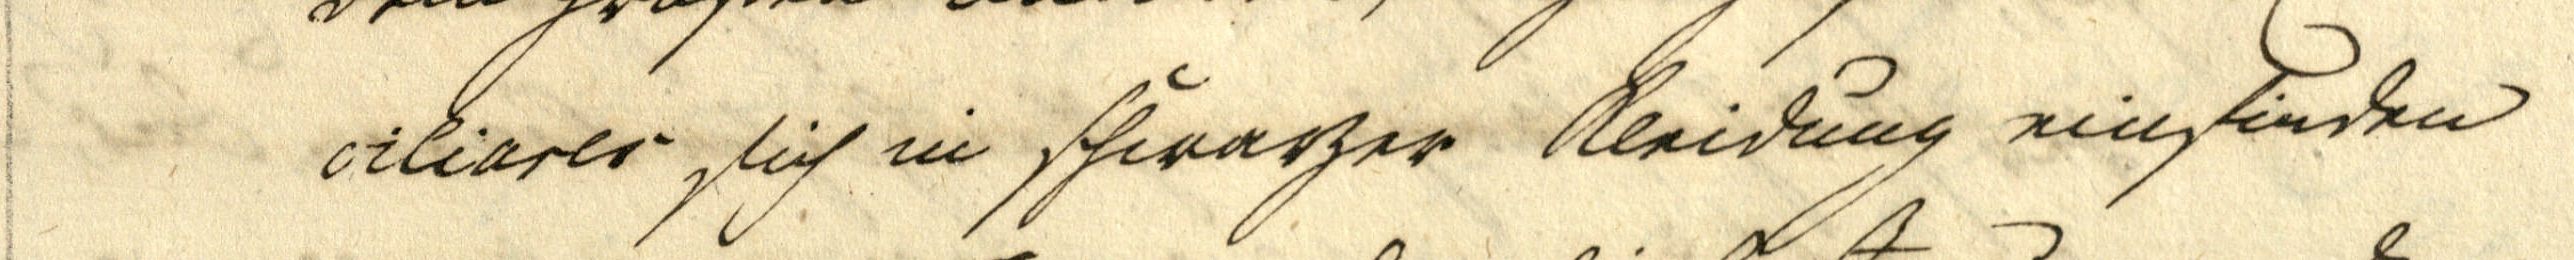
ciliares sich in schwarzer Kleidung einfinden
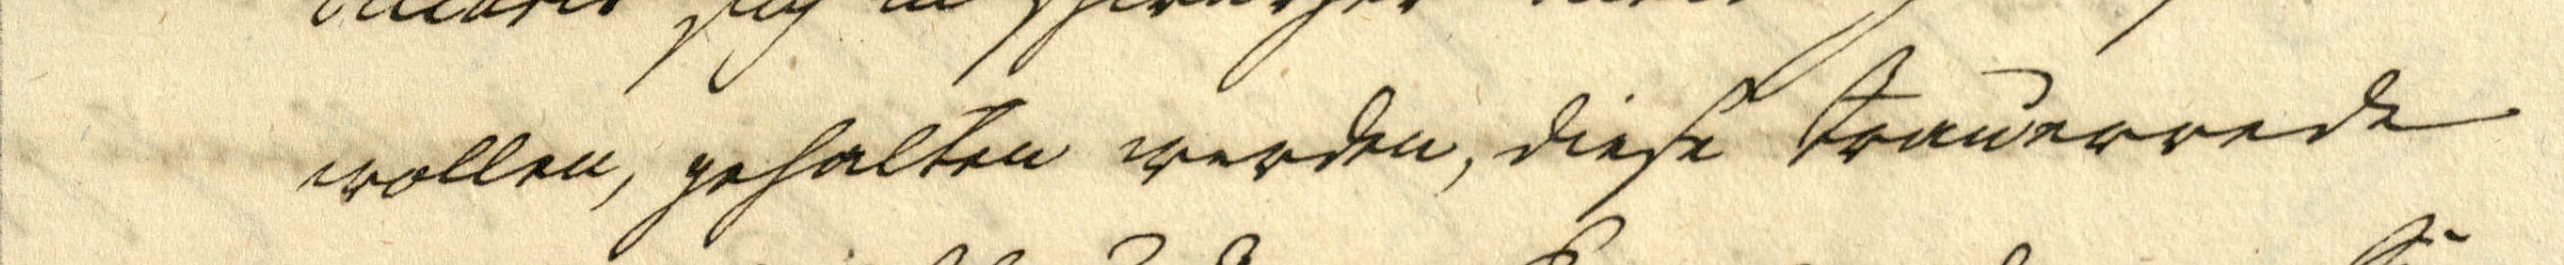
wollen, gehalten werden, diese Trauerrede
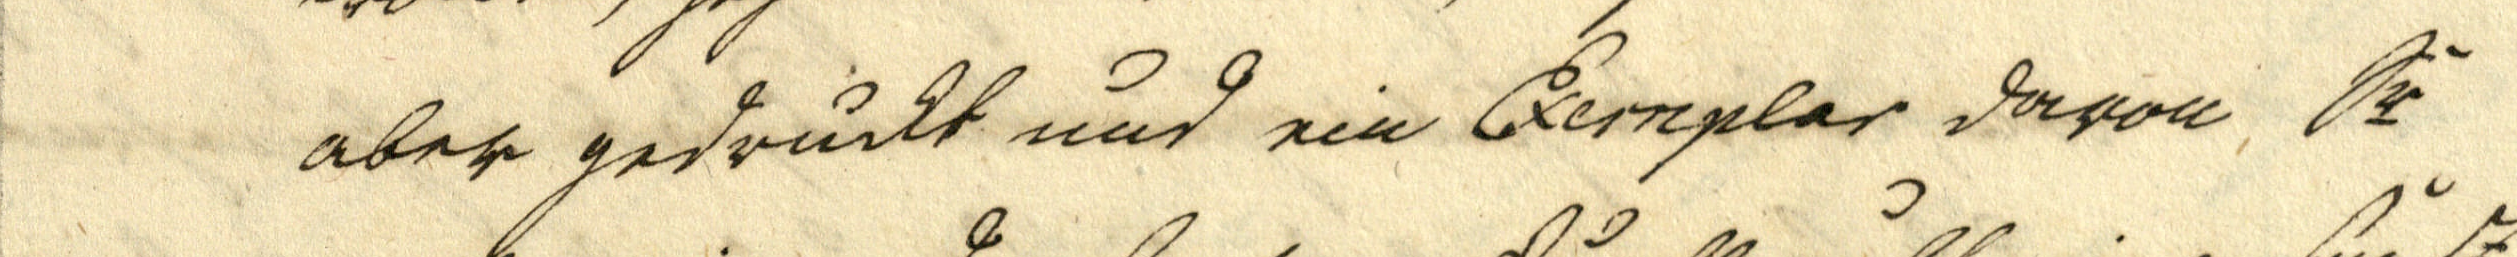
aber gedruckt und ein Exemplar davon Sr.
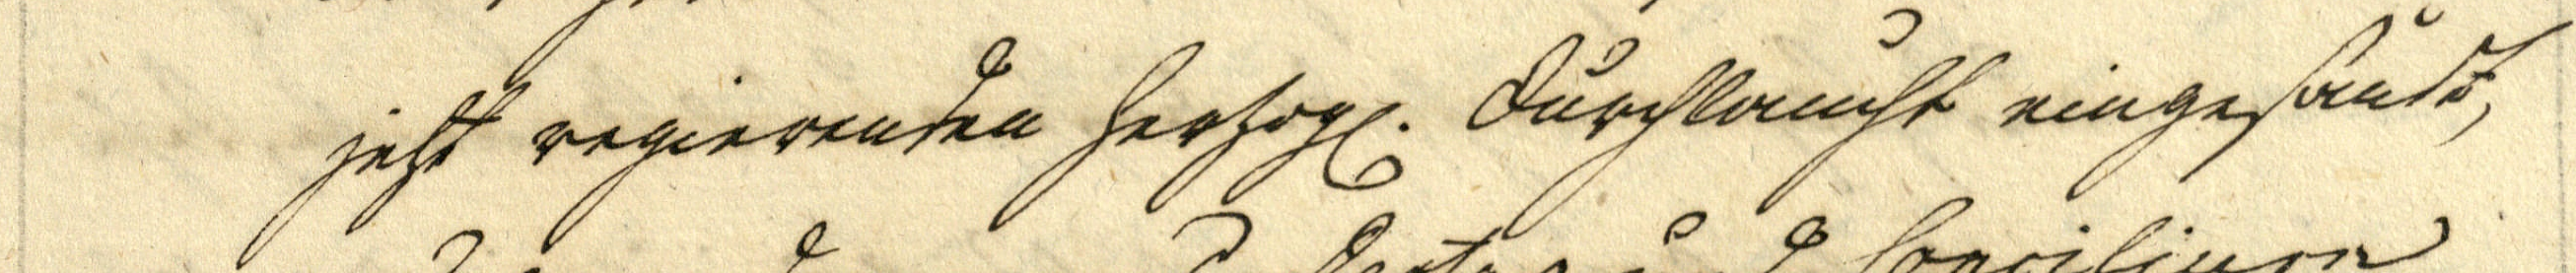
jetzt regierenden herzogl. Durchlaucht eingesandt,
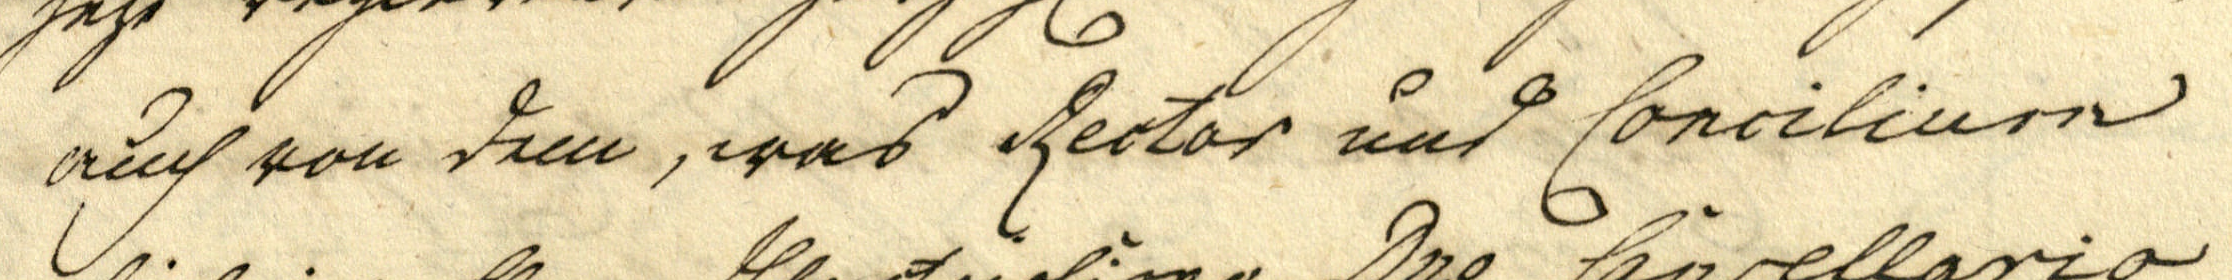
auch von dem, was Rector und Concilium
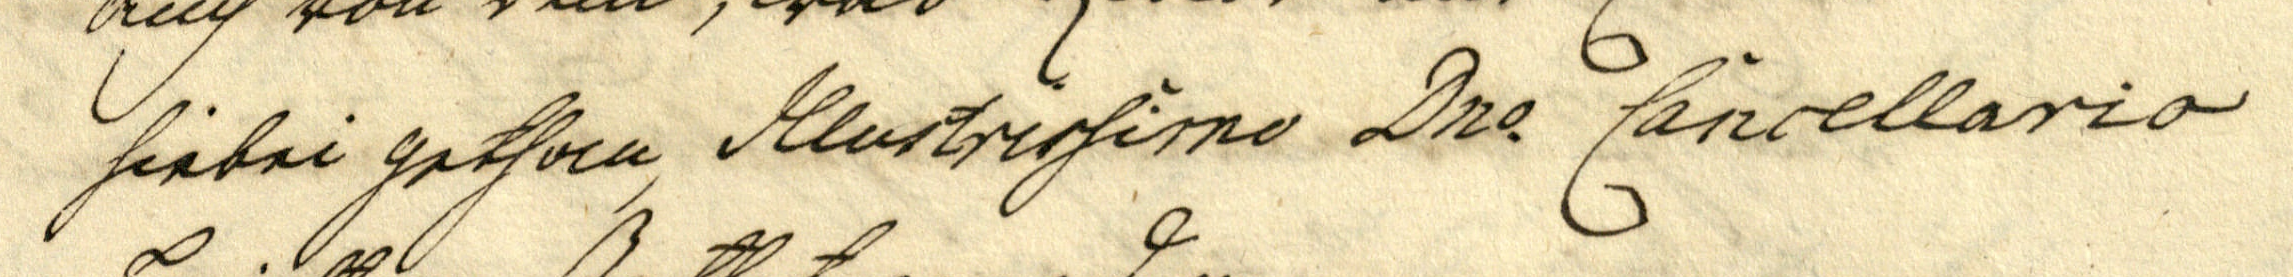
hiebei gethan, Illustrissimo Dno. Cancellario
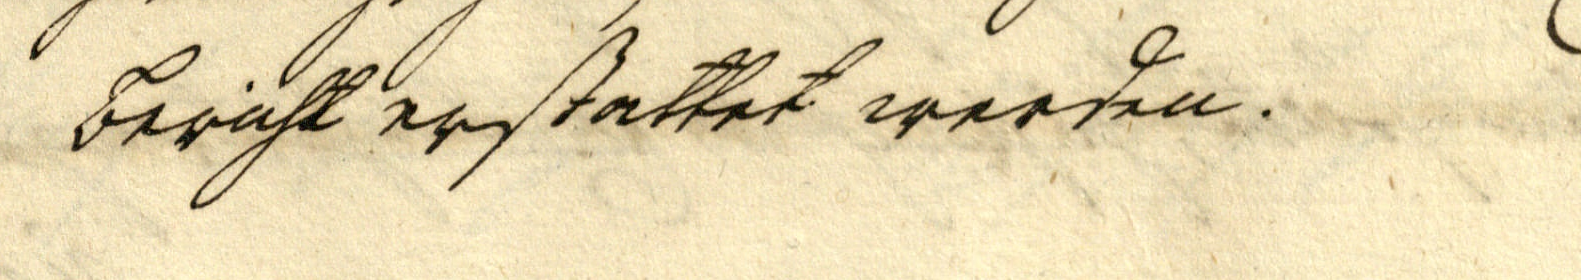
Bericht erstattet werden.
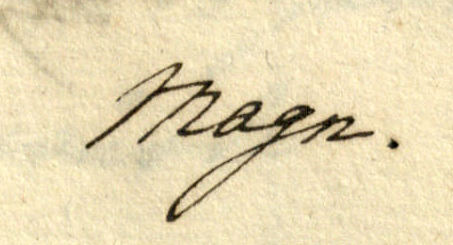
Magn.
